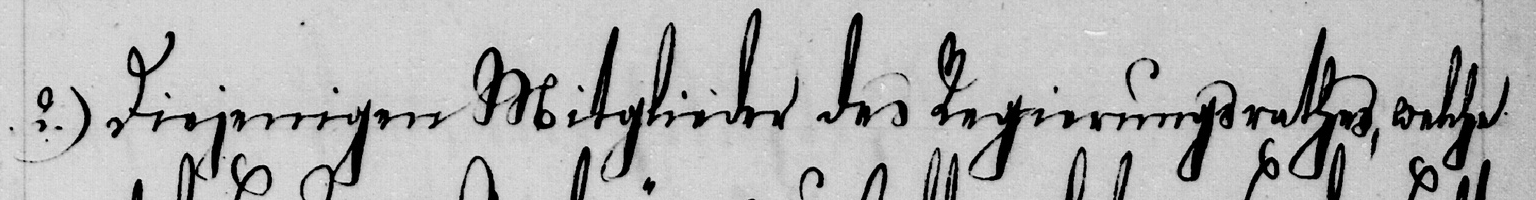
2.) Diejenigen Mitglieder des Regierungsrathes, welche
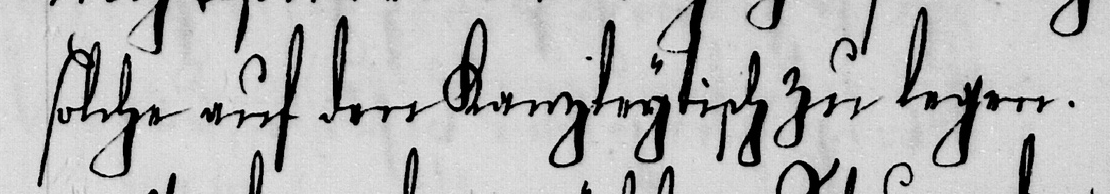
solche auf den Kanzleytisch zu legen.
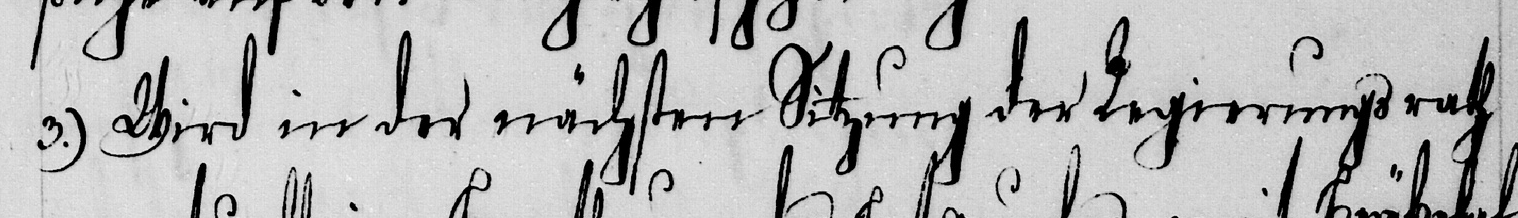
3.) Wird in der nächsten Sitzung der Regierungsrath
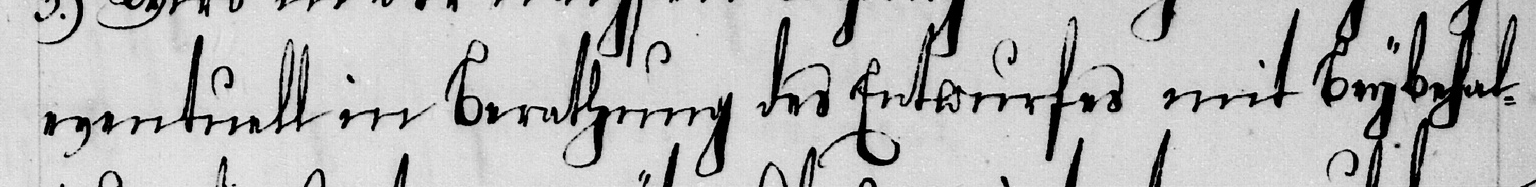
eventuell in Berathung des Entwurfs mit Beybehal¬
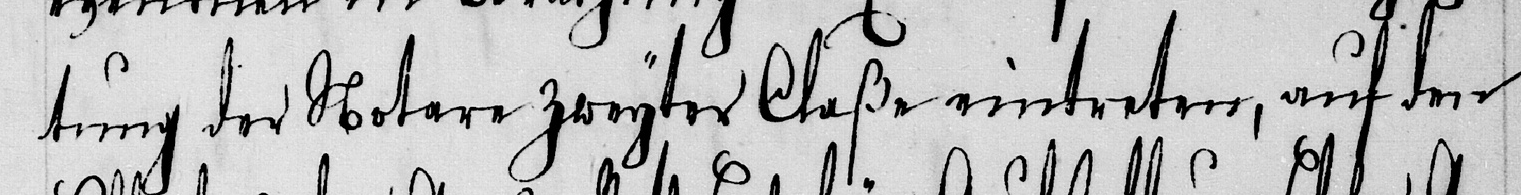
tung der Notare zweyter Claße eintreten, auf den
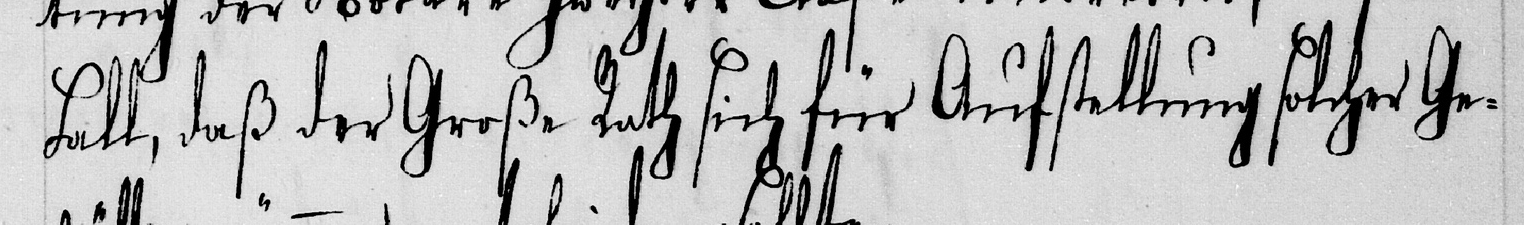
daß der Große Rath sich für Aufstellung solcher
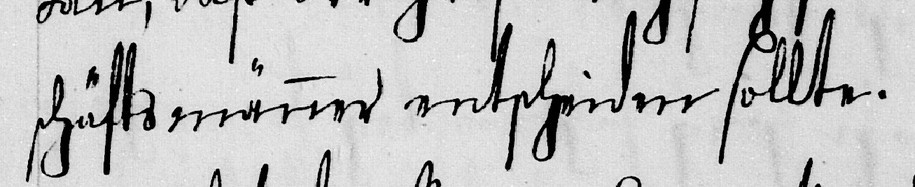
schäftsmänner entscheiden sollte.
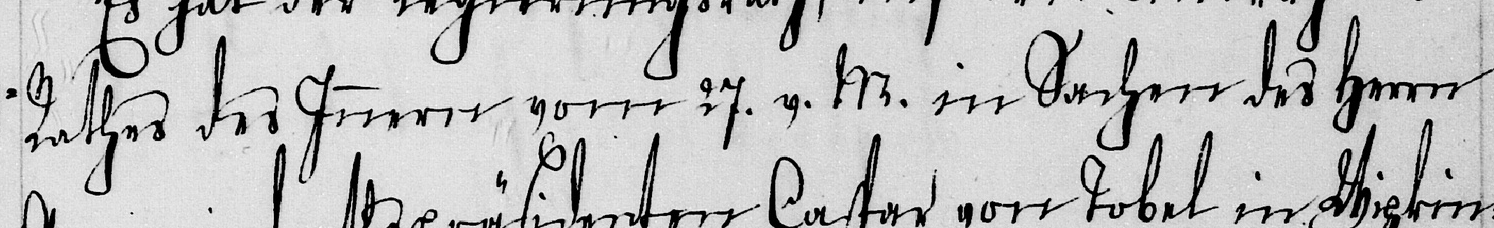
Rathes des Innern vom 27. v. M. in Sachen des Herrn
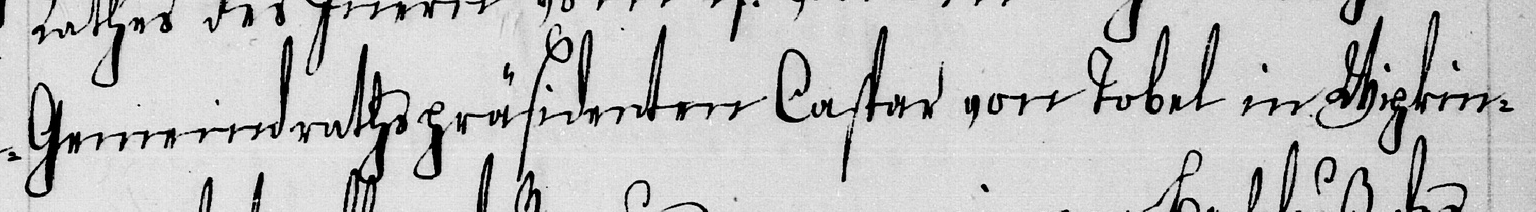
Gemeindrathspräsidenten Caspar von Tobel in Wipkin¬
